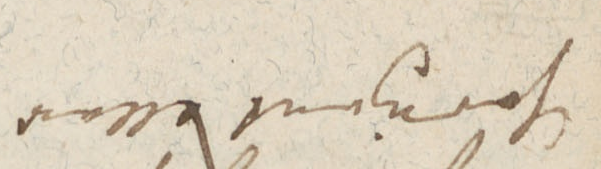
so dass wir sie diese
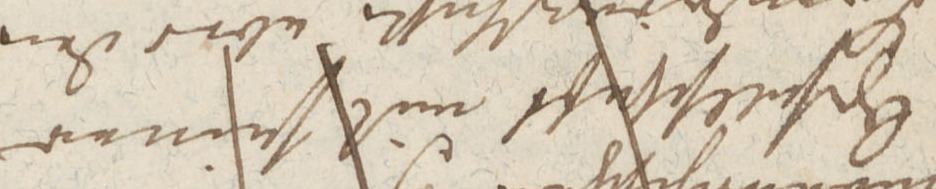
und eine neue weit entwickeltere
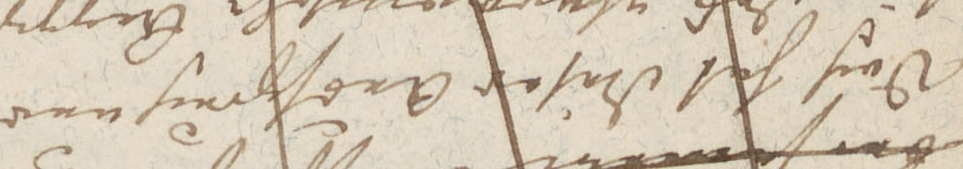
westasiatischen Bauprinzipes ist; –
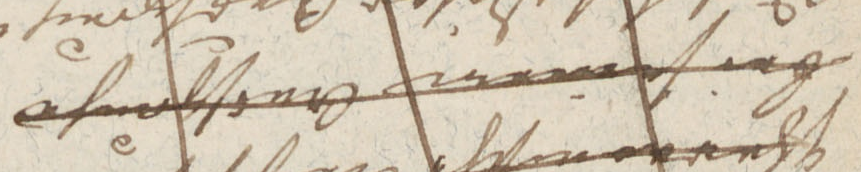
wollen wir in Bezug auf diesen Gegen-
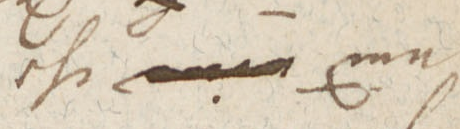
der Sitten des ander
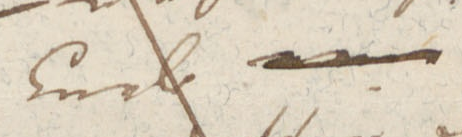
was bei anderen
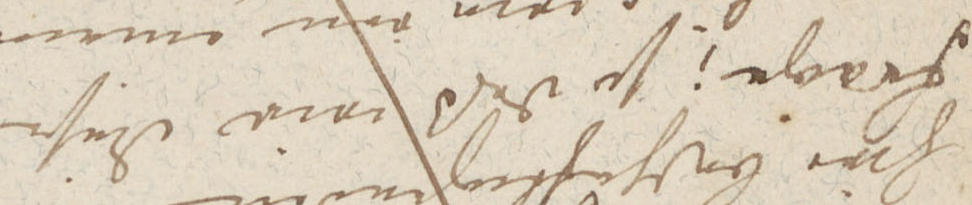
Frage; so dass wir diese
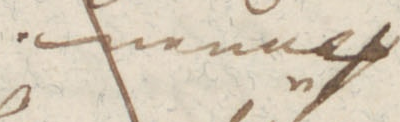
entgegengesetzten
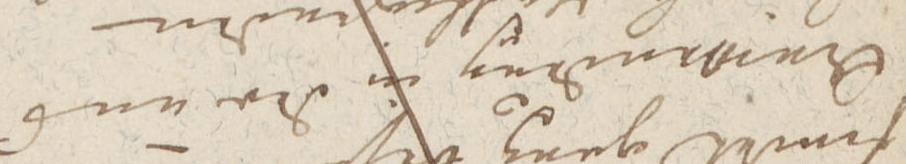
und eine ihr eine ganz
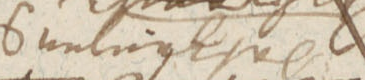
der Ursprung ders pharaonischen
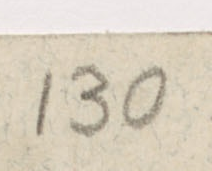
130
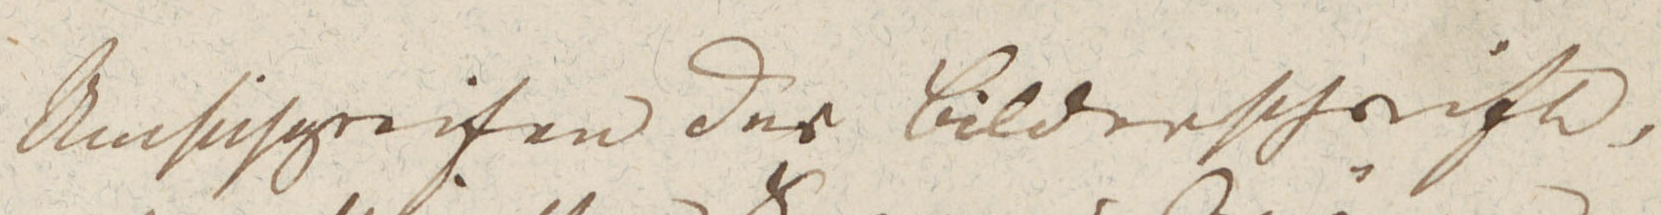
Umsichgreifen der Bilderschrift,
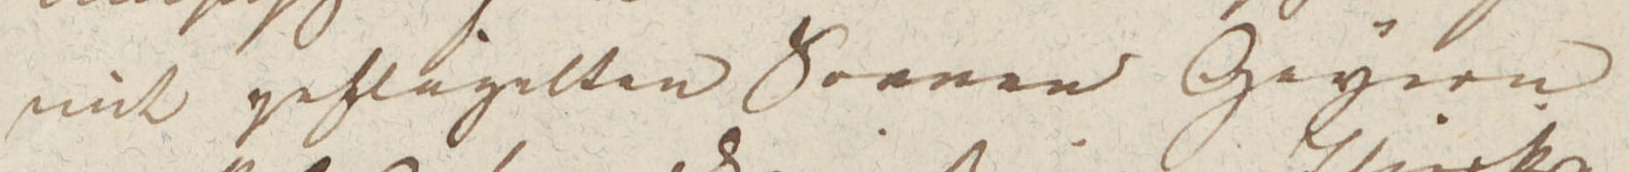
mit geflügelten Sonnen Geyern
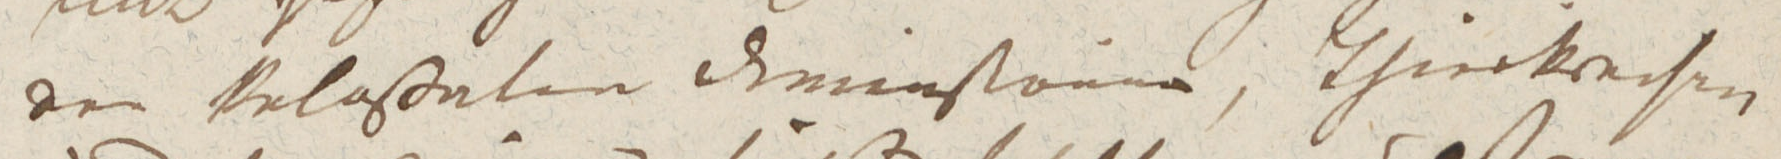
von kolossalen Dimensionen, Thierkreisen
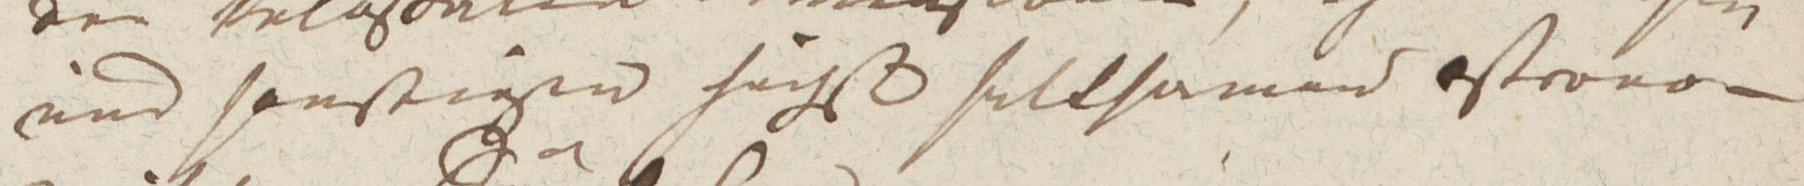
und sonstigen höchst seltsamen astrono-
